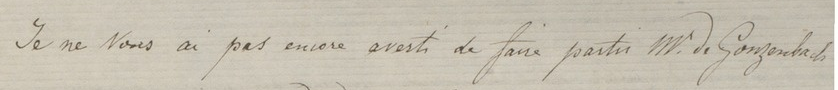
Je ne Vous ai pas encore averti de faire partir Mrde Gonzenbach
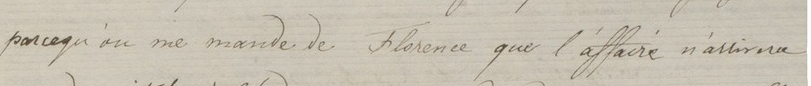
parcequ'on me mande de Florence que l'affaire n'arrivera
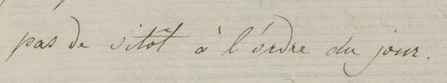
pas de sitôt à l'ordre du jour.
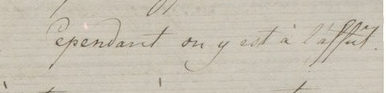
Cependant on y est à l'affût.
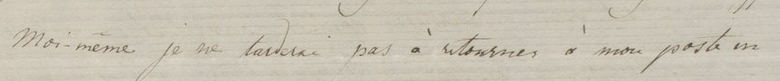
Moi-même je ne tarderai pas à retourner à mon poste en
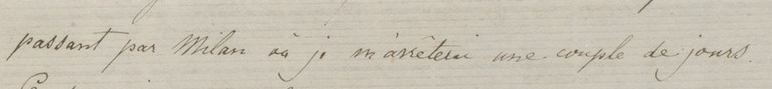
passant par Milan où je m'arrêterai une couple de jours.
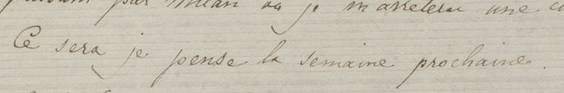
Ce sera je pense la semaine prochaine.
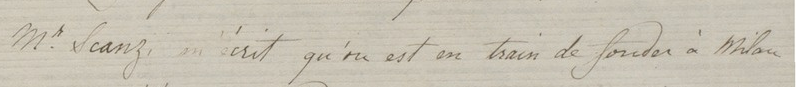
MrScanzi m'écrit qu'on est en train de fonder à Milan
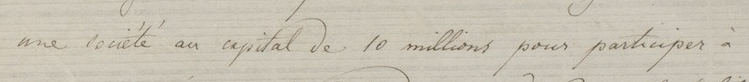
une société au capital de 10 millions pour participer à
